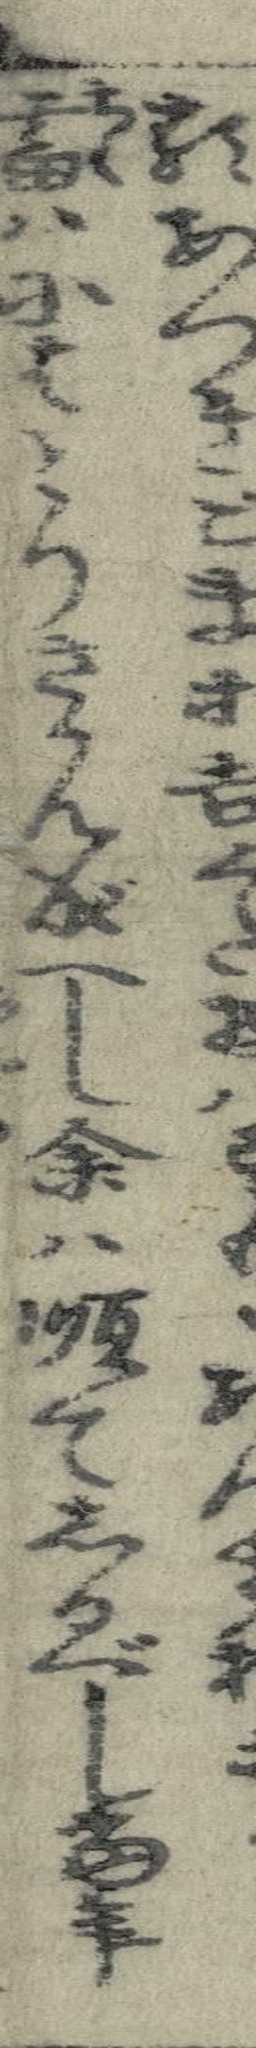畜はにはとりさかん成へし余は順てしるべし当年
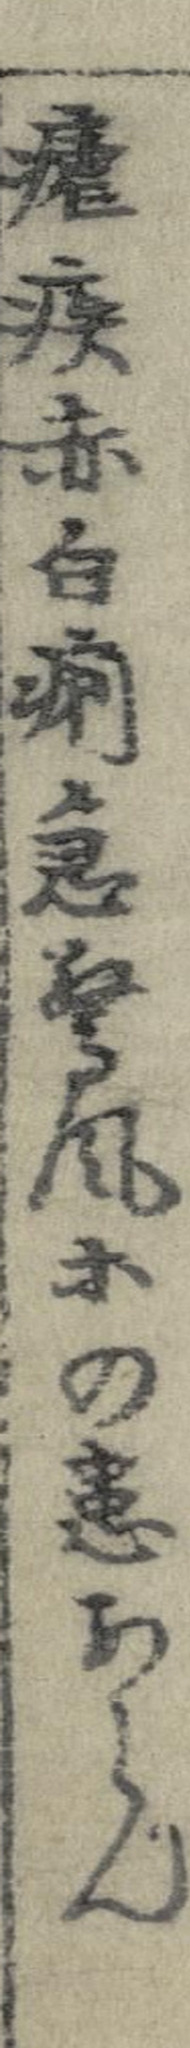瘧疾赤白痢急驚風等の患あらん
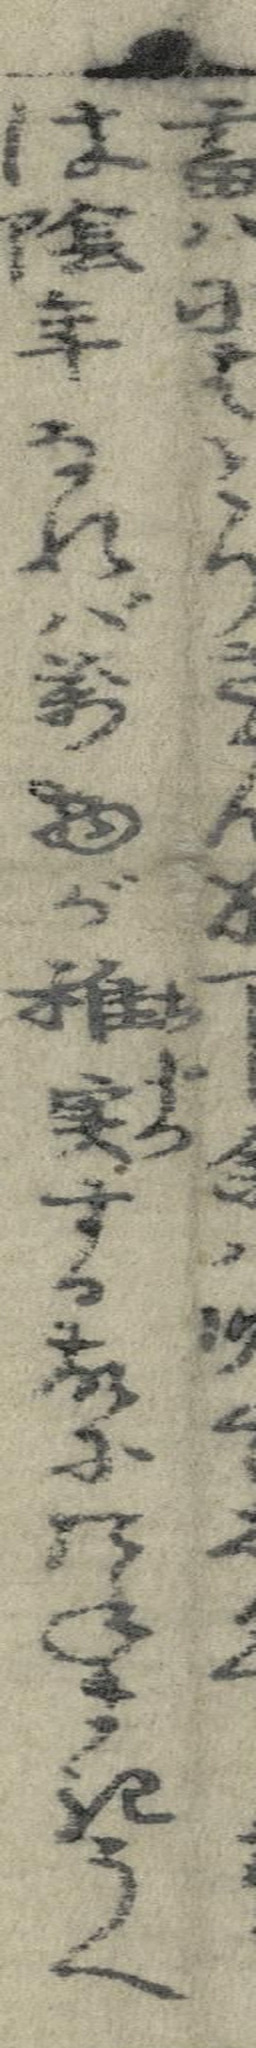は陰年なれば万物が稚実する故にたねすきうへ
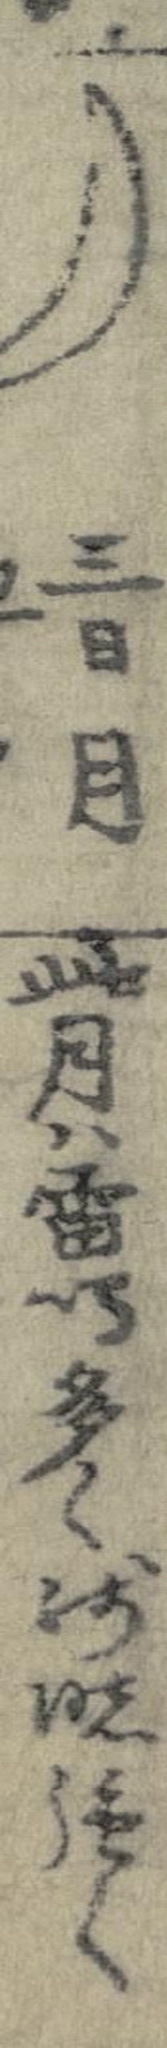七月☽卑ク此月は雷鳴多く残照強く
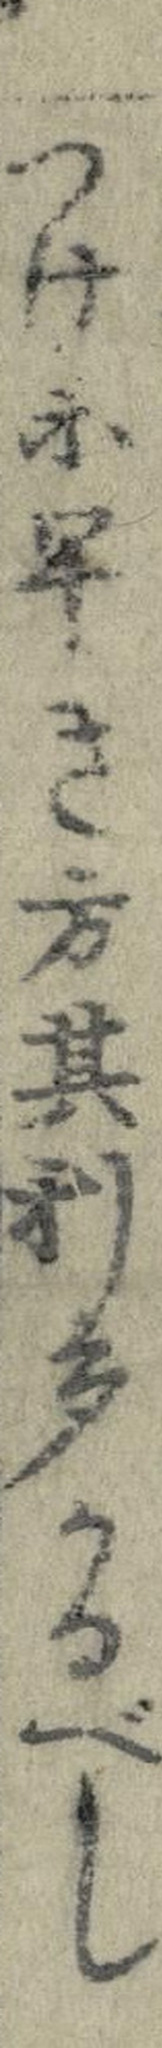つけに早き方其利多かるべし
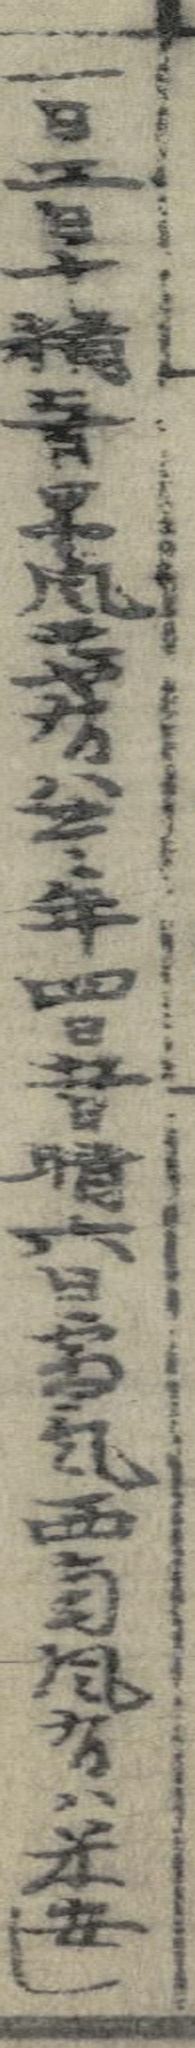一日二日十精三日早風モヤ有は壱年四日五日晴六日曇気西南風有は米安し
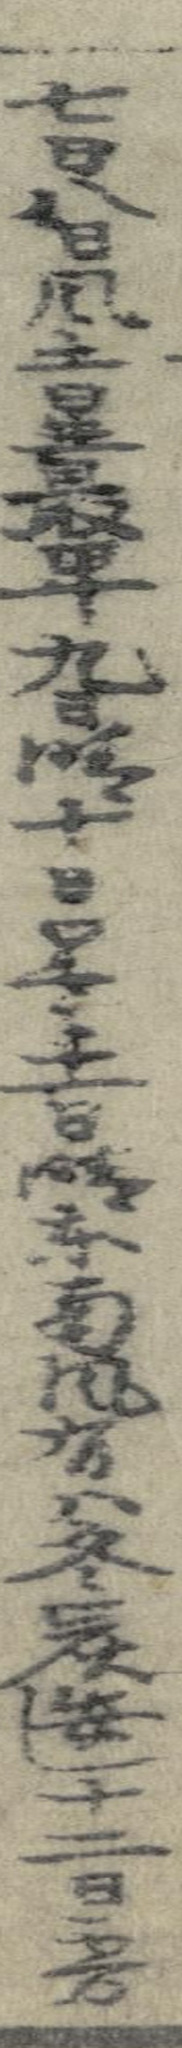七日八日風土星最卑九日晴十日曇十一日晴東南風有は冬炭安し十二日雱
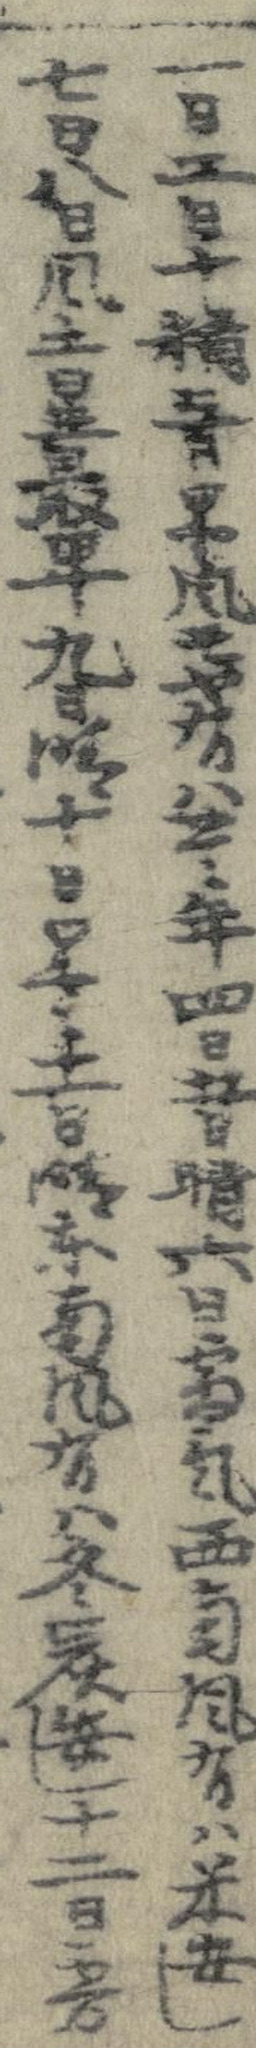七日八日風土星最卑九日晴十日曇十一日晴東南風有は冬炭安し十二日雱
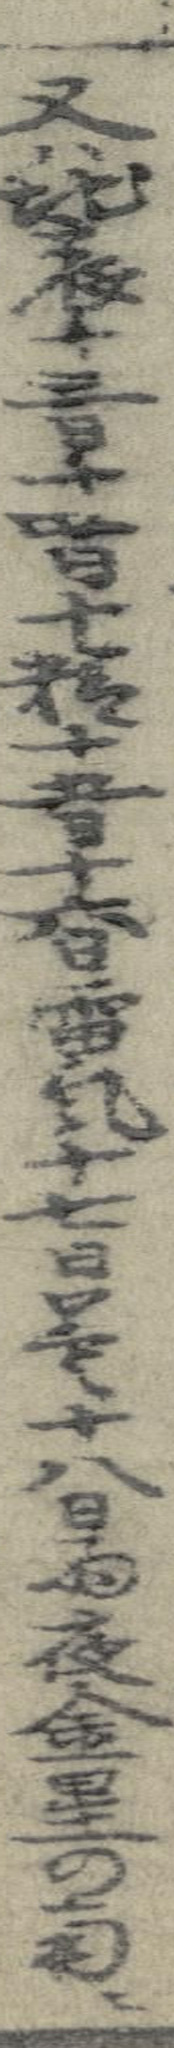又は地震十三日十四日十精十五日十六日雷気十七日曇十八日雨夜金星の南に
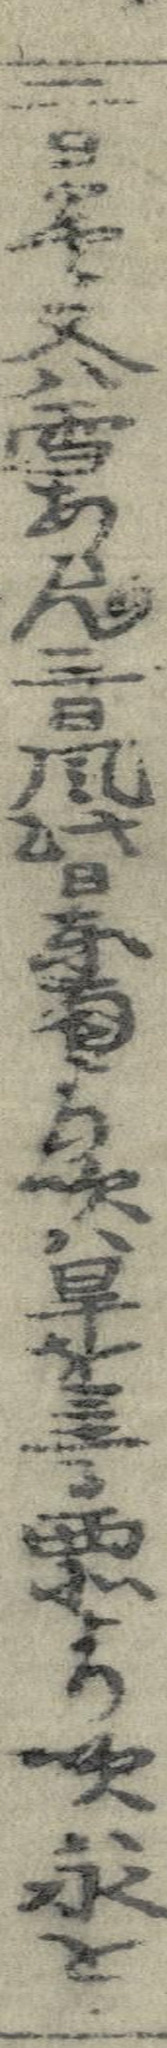二日曇又は雪あらん三日風此日東南から吹は旱をる西北より吹は水を
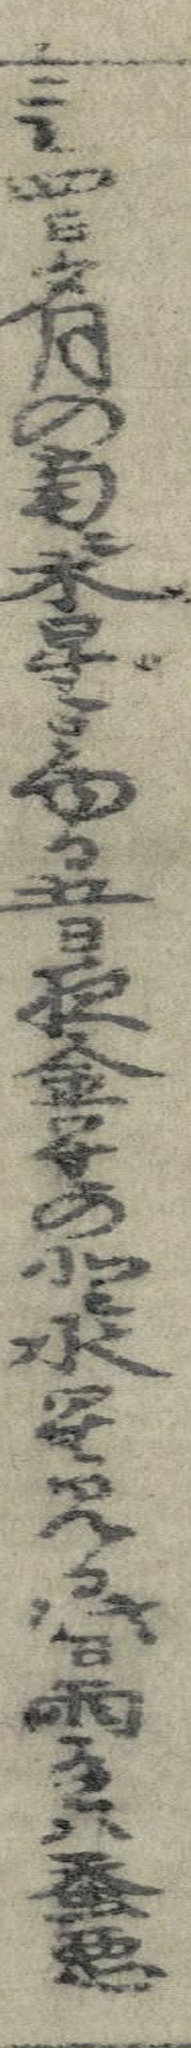含四日夕月の南木星みゆる五日夜金星の北水星見る此日雨有は蚕悪
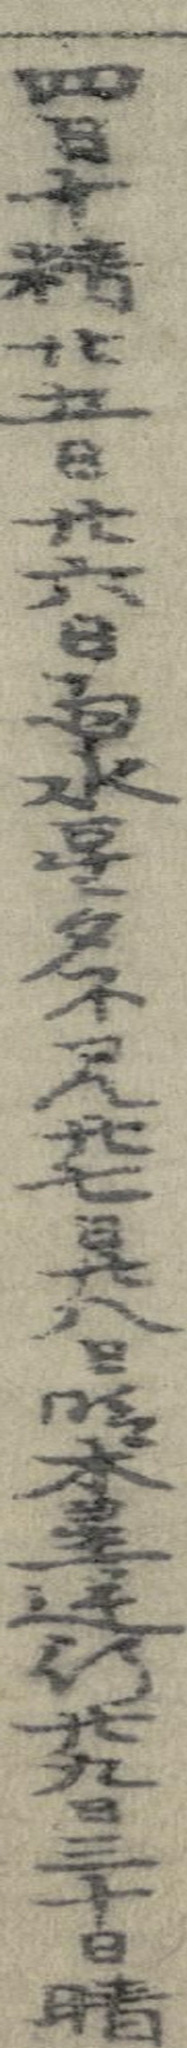四日十精廿五日廿六日雨水星夕不見廿七日廿八日晴水星逆行廿九日三十日晴
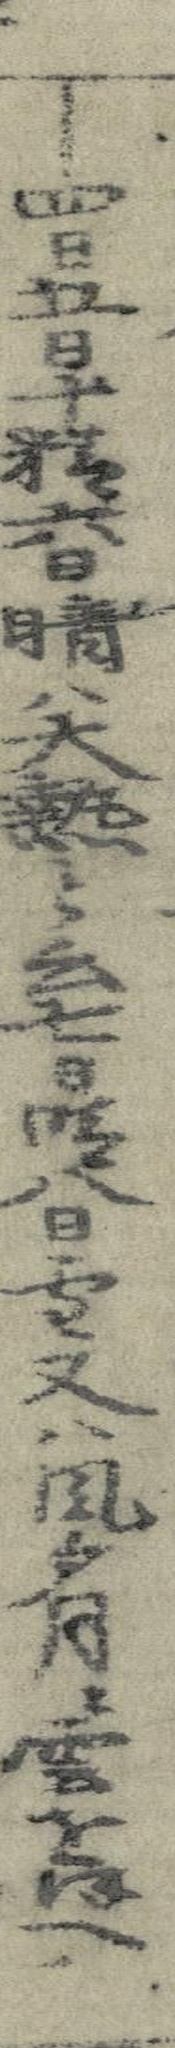し四日五日十精六日晴は大熱と云七日晴八日雪又は風夕月に雲をほへは
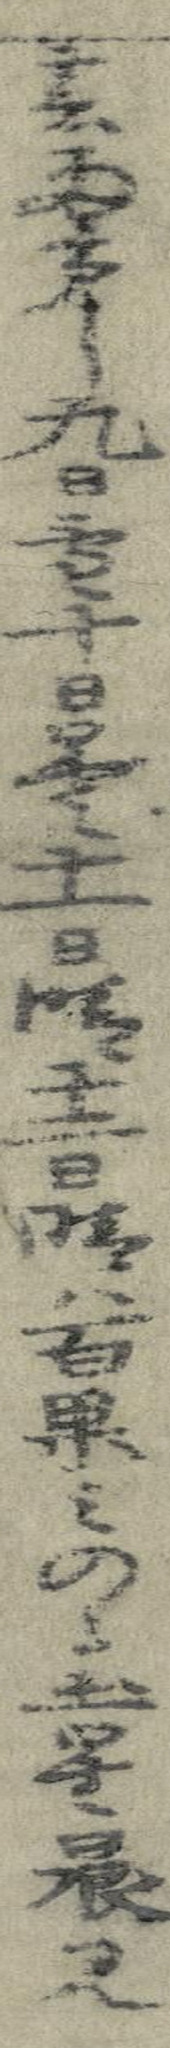雲当るへし九日雪十日曇十一日晴十二日晴は百果みのる土星晨見
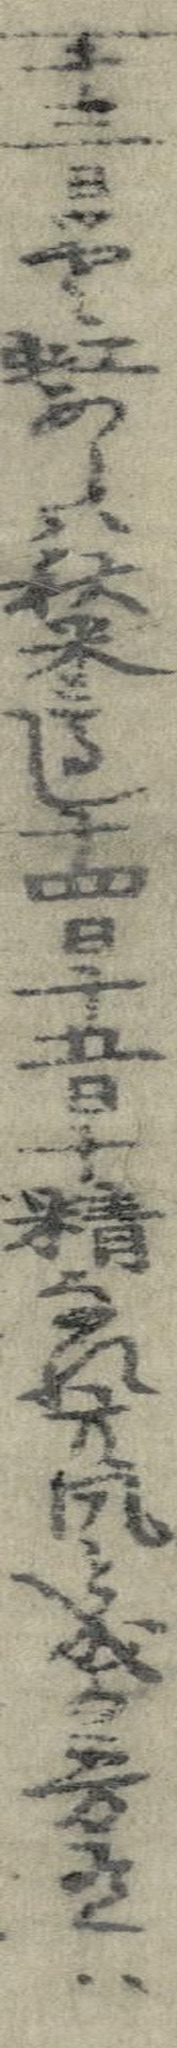十三日曇虹あらは秋果髙し十四日十五日十精なれ共風と成か方有は
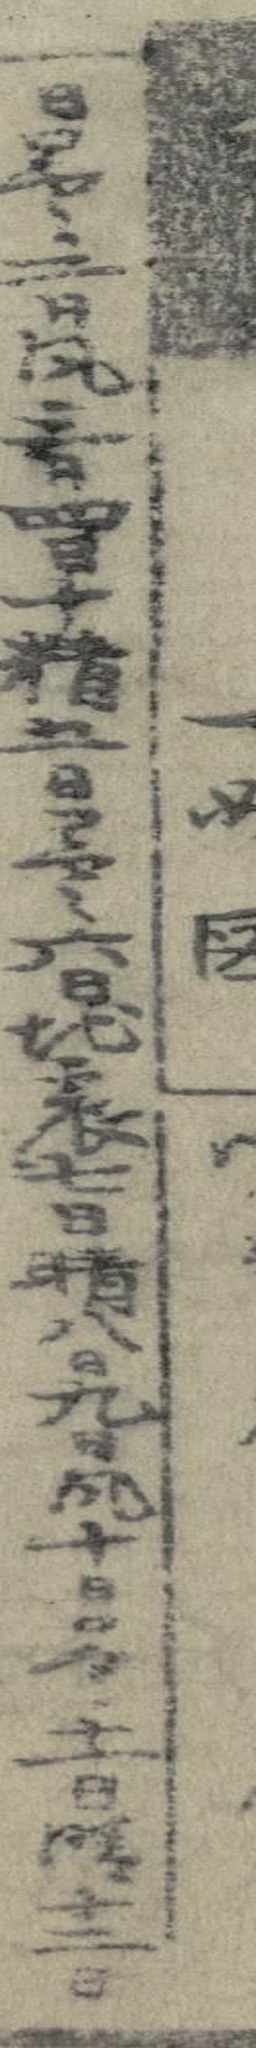一日曇二日風三日四日十精五日曇六日地震七日晴八日九日風十日雨十一日晴十二日
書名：天保十六年乙巳七曜　晴雨考　土御門殿御免
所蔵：東京大学地震研究所図書室 Earthquake Research Institute Library, The University of Tokyo, JAPAN
